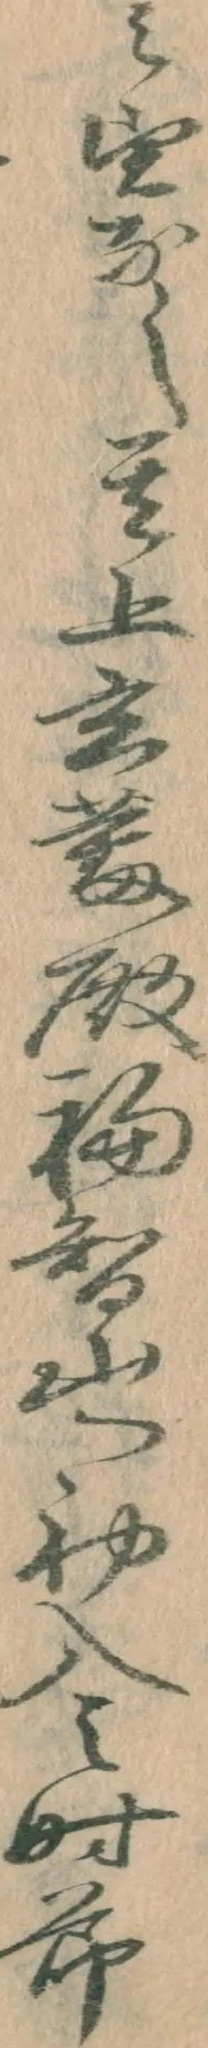之由なし其上玄蕃殿福智山へ初入之時節
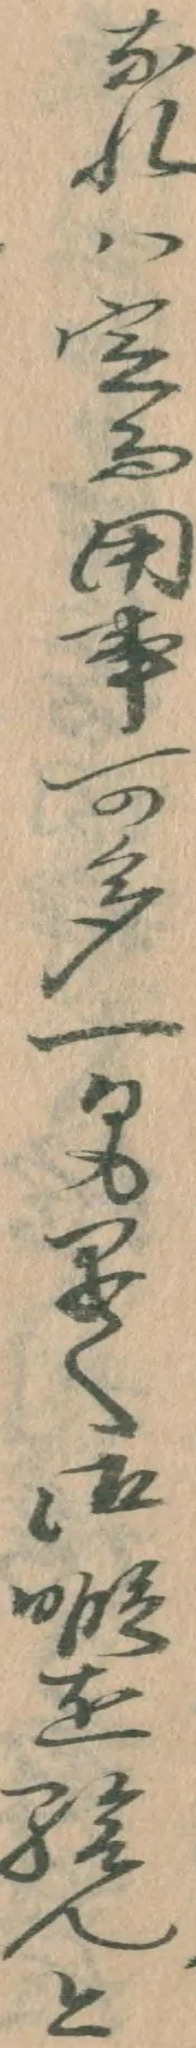なれは定而用事可多一日も早く御暇を給んと
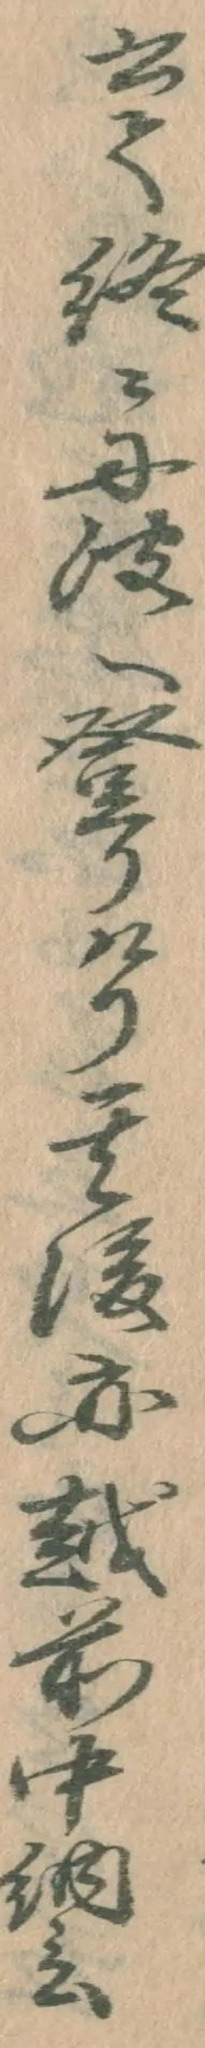云て終に丹波へ登りけり其後亦越前中納言
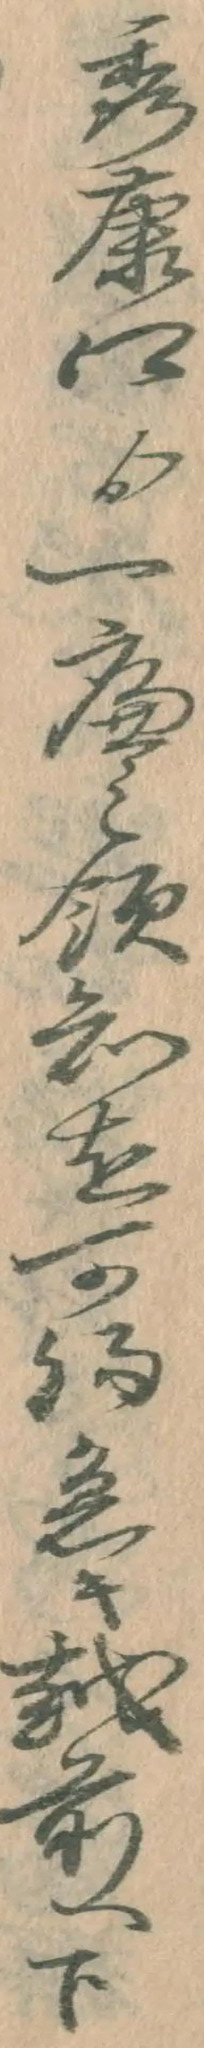秀康卿より一篇之領知を可約急き越前へ下
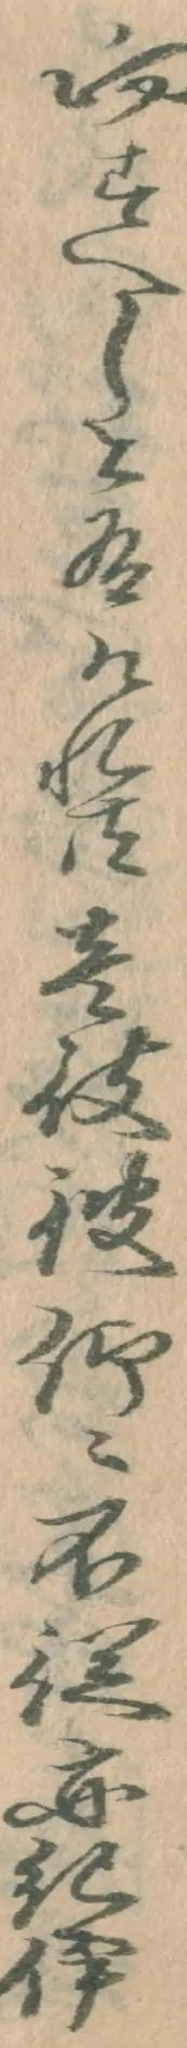向春へしと有けれ共壱岐彼仰に不従亦紀伊

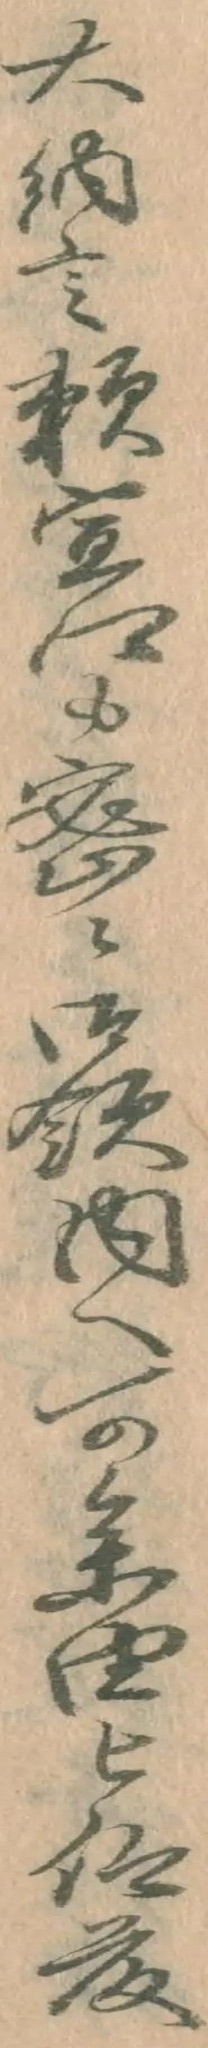大納言頼宣卿も密に御領内へ可参由被仰藤
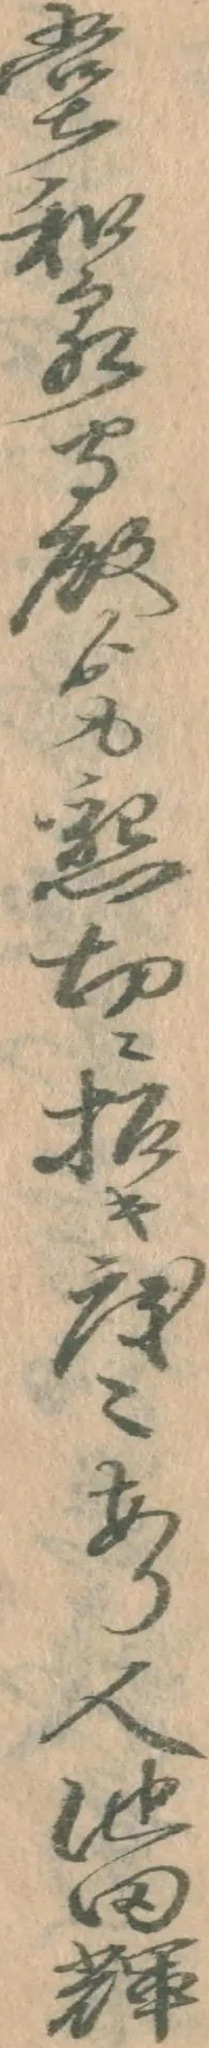堂和泉守殿ゟも懇切に招き度々あり人池田輝
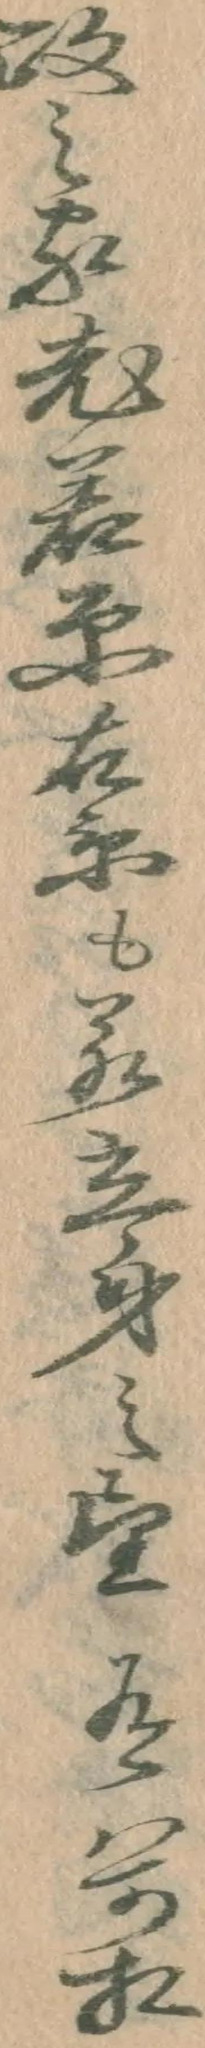政之家老若原右京も若立身之望有は可相
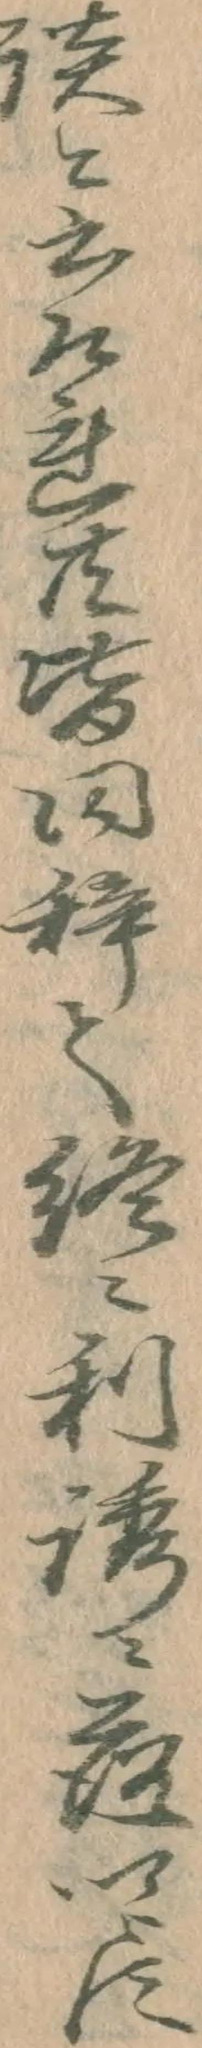談と云け連共皆同辞て終に利誘に落以ら須
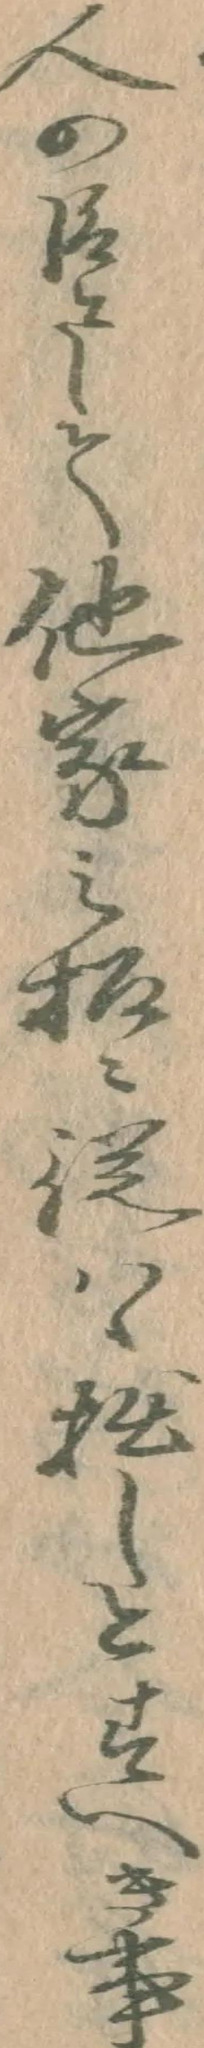人の臣として他家之板に従はゝ拙しと春へき事
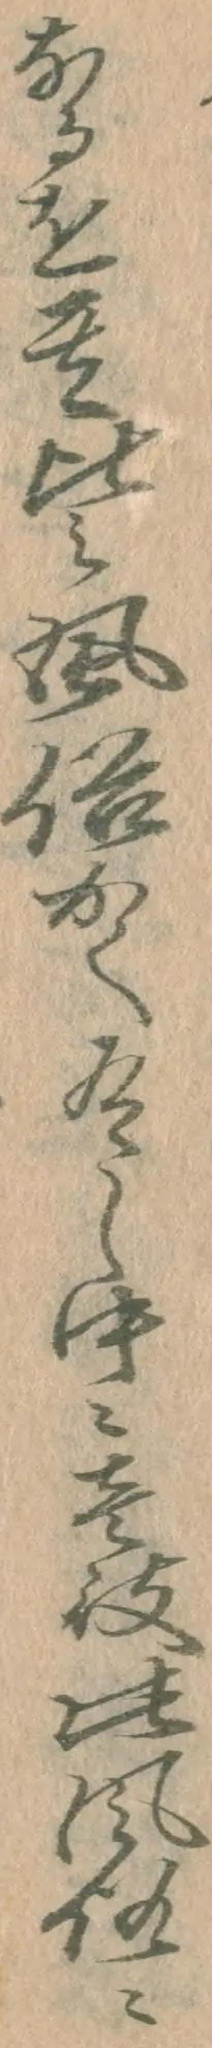なるを其比之風俗かく有し中に壱岐此風俗に
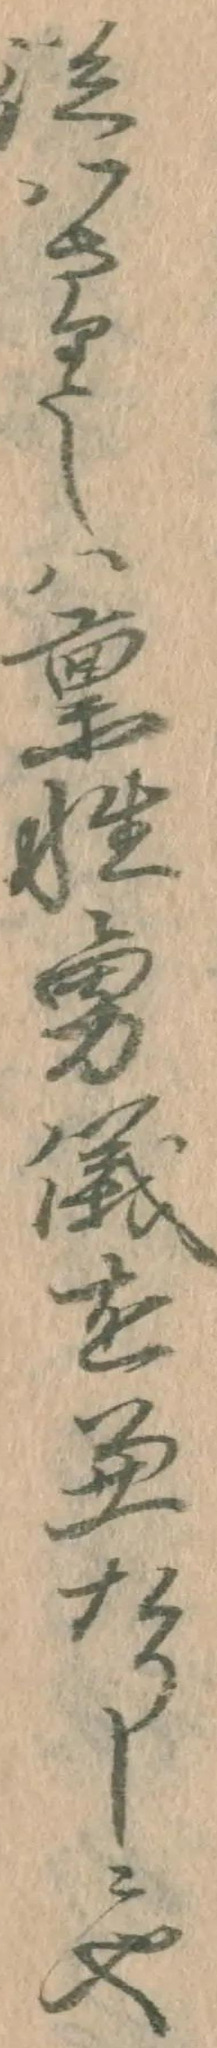従はさ里しは稟性に男儀を兼たりしにや
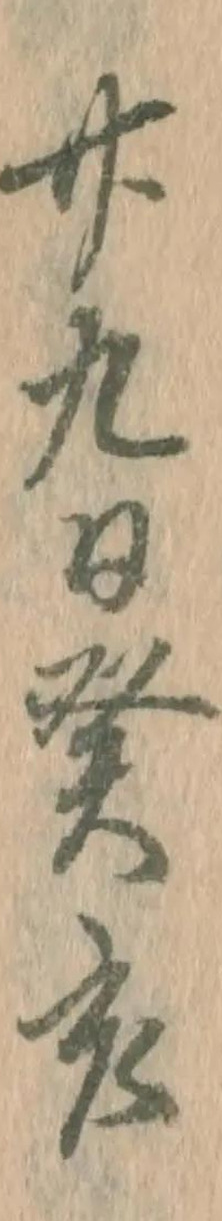廿九日癸亥
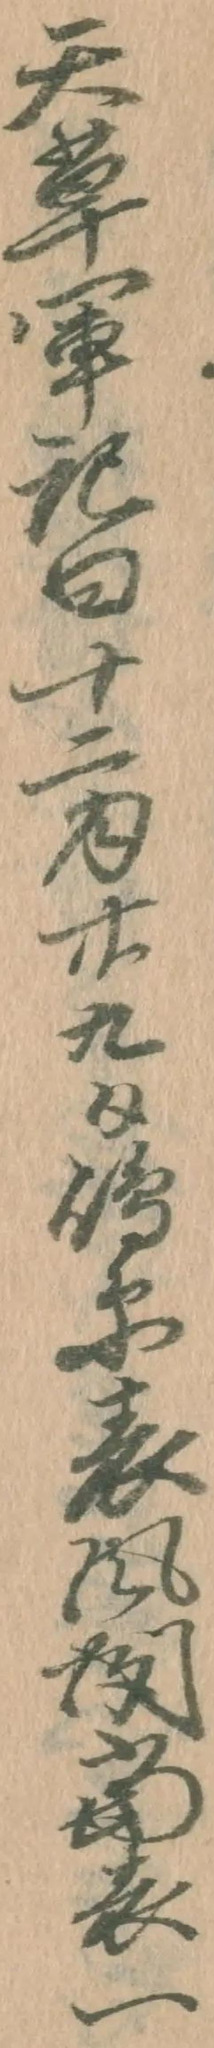天草軍記曰十二月廿九日島原表風聞当表一
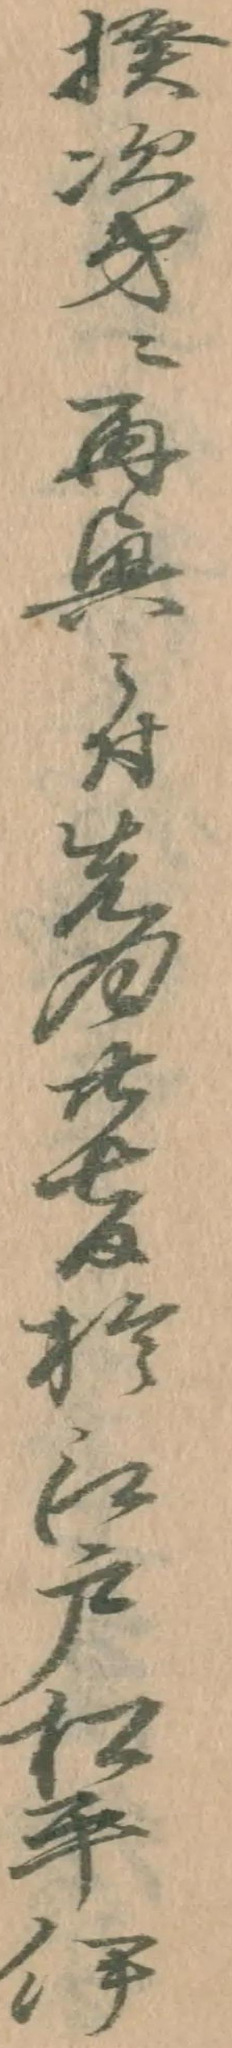揆次第に再興に付先月廿七日於江戸松平伊
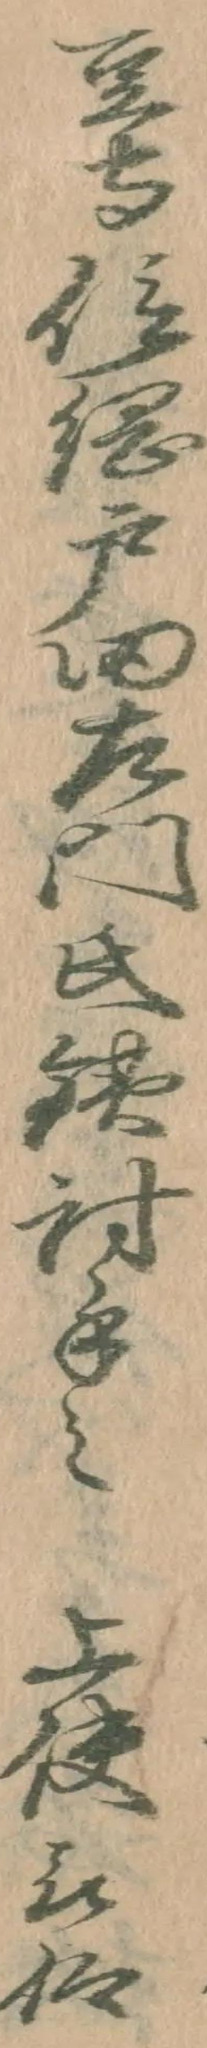豆守信総戸田左門氏銕討手之上使被仰
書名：切支丹御退治記 49巻. [5]
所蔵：国立国会図書館 National Diet Library, JAPAN
